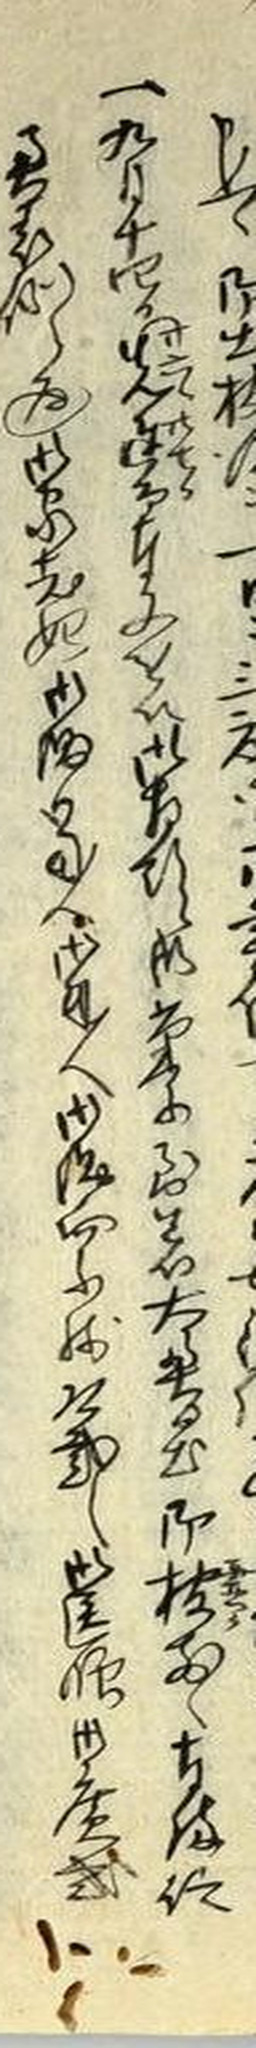奥表例之通御家老始御側御用人御用人御側向不残頂戴之御医師御広式
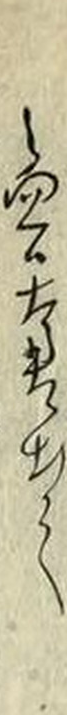之向ハ大奥へ出之
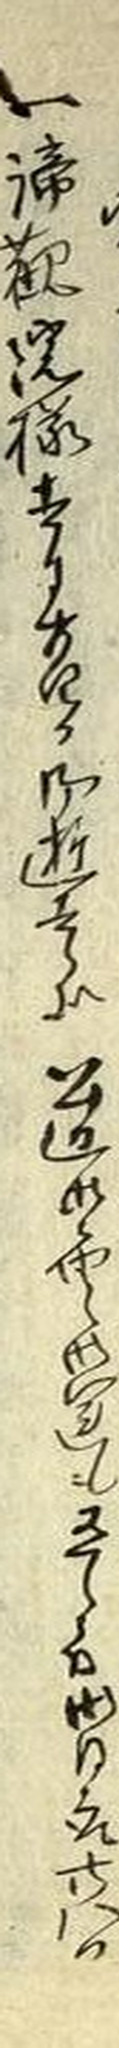一諦観院様去月廿四日御逝去之処公辺御届之御運も有之ニ付御日取廿八日
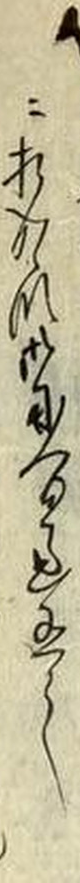ニ相成候段御用人ゟ通有之
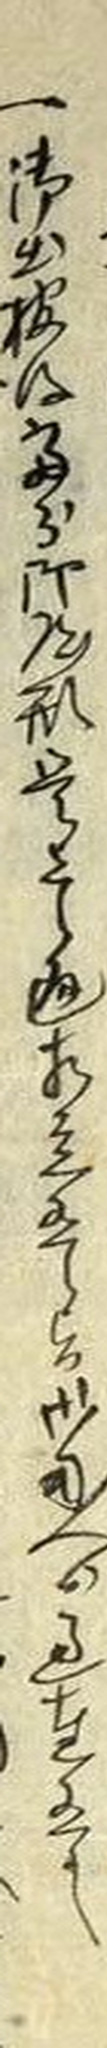一御出棺後当分御屋形是迄之通相立有之旨御用人ゟ通達有之
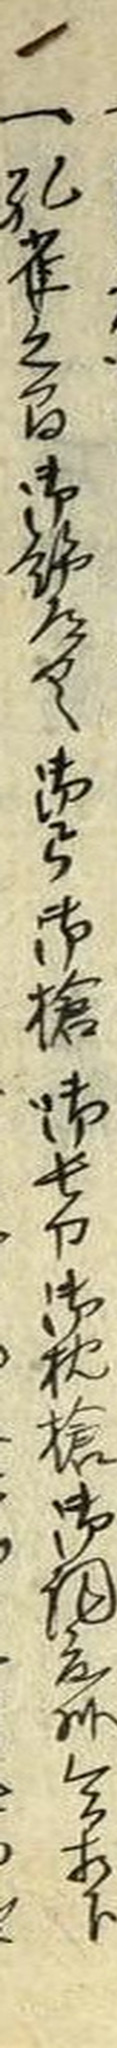一孔雀之間御飾道具御弓御槍御長刀御枕槍御調度掛今日相下
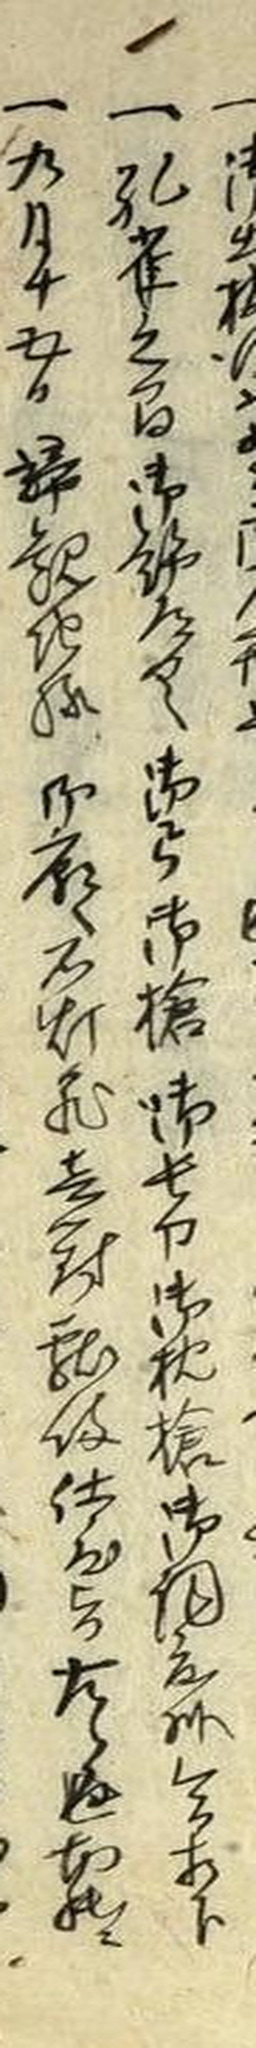一九月十五日諦観院様御廟へ石灯籠壱対献備仕度旨左之通切紙ニ
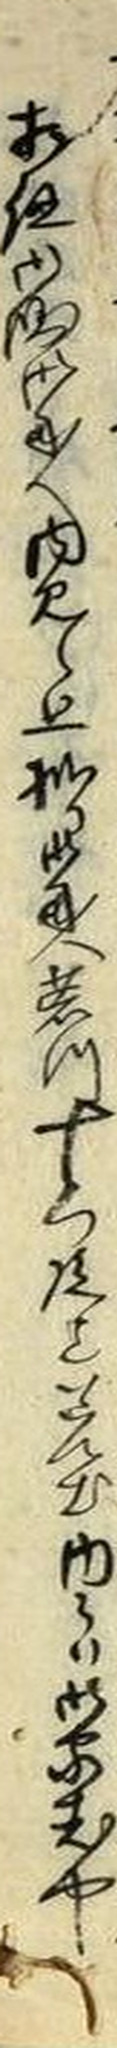相認御側御用人内見之上掛り御用人荒川十右衛門殿迄差出内々ハ御家老中

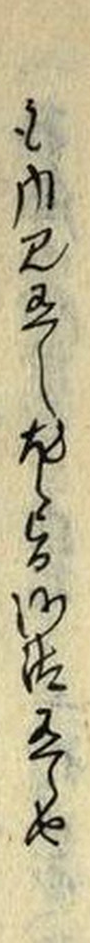も御内見有之尤之旨沙汰有之由
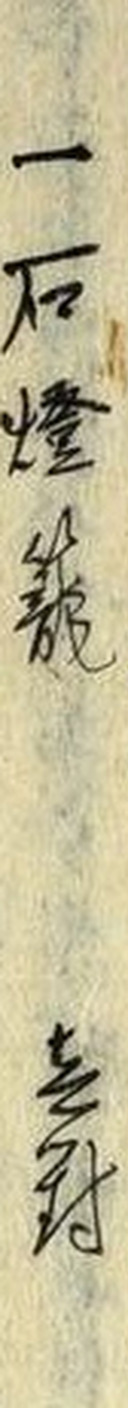一石灯籠壱対
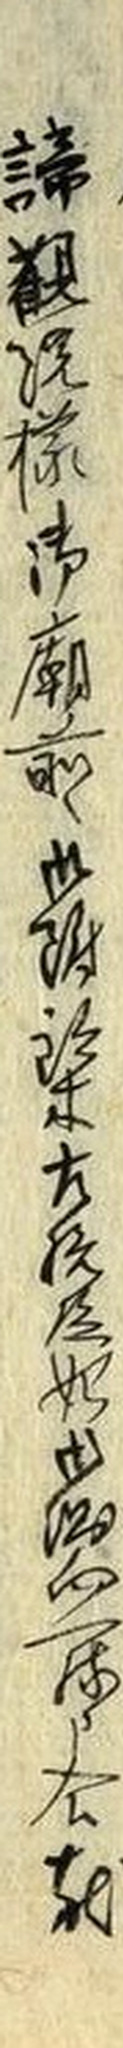諦観院様御廟前へ御附鈴木左膳殿始御側向一統申合献
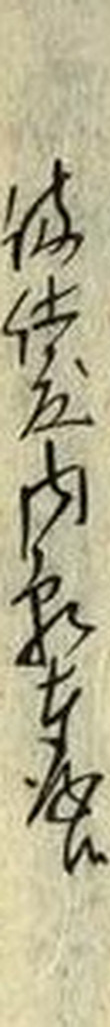備仕度内願奉存候
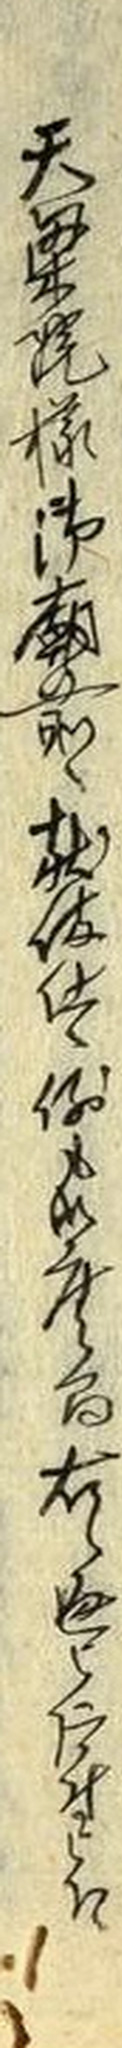天梁院様御廟前へ献備仕候例も御座候間右之通被仰付被下
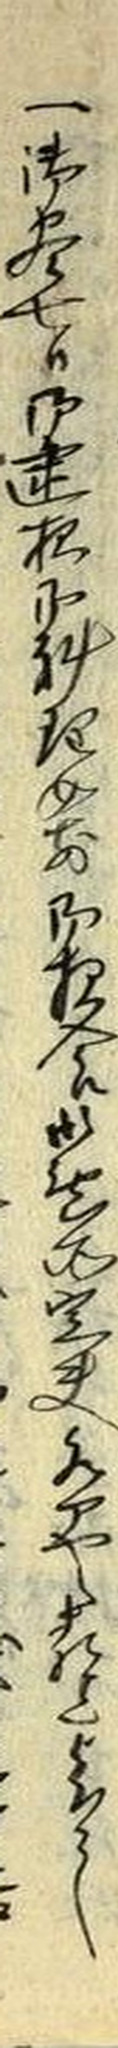一御尽七日御逮夜御料理如前御夜食御台所定夫両部や表迄被下之
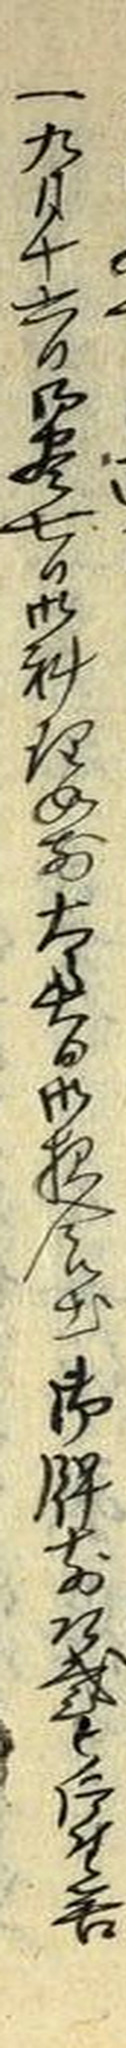一九月十六日御尽七日御料理如前大奥ゟ御夜食出御牌前頂戴被仰付候筈
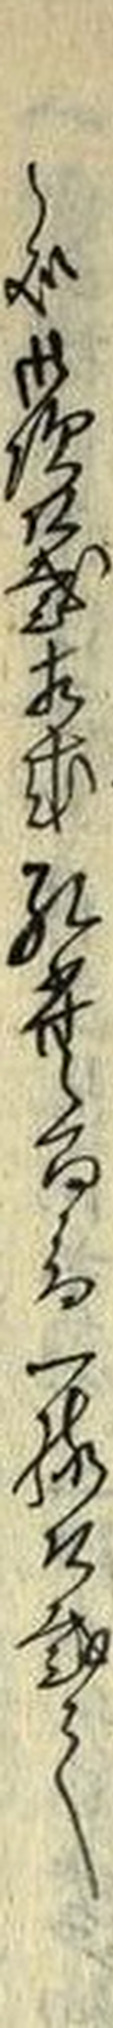之処御次頂戴相成孔雀之間ニ而一統頂戴之
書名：少傅日録抄（斉善付側向頭取日記、江戸并道中、初入在国、逝去後…
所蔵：福井県文書館 Fukui Prefectural Archives
